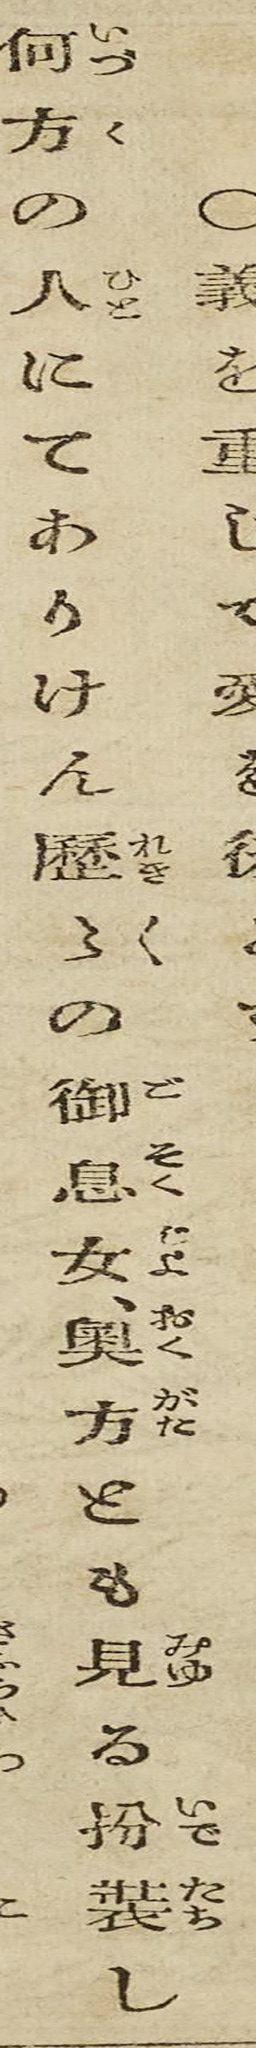何方の人にてありけん歴〻の御息女、奥方とも見る扮装し
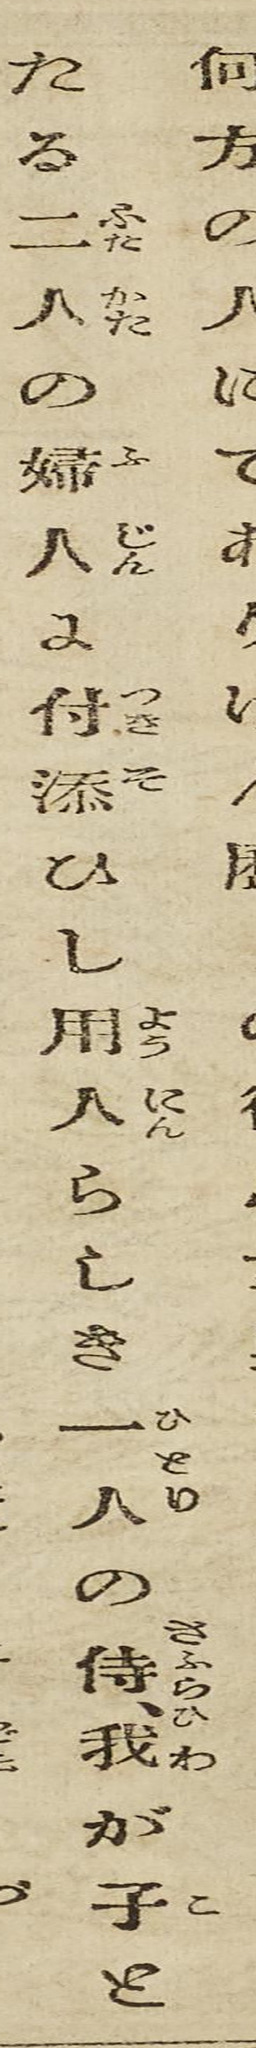たる二人の婦人に付添ひし用人らしき一人の侍、我が子と
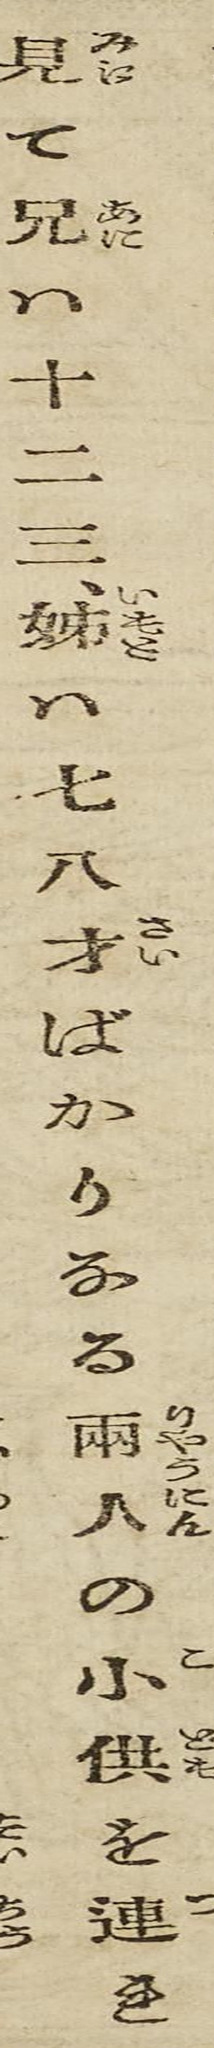見て兄は十二三、妹は七八才ばかりなる両人の子供を連れ
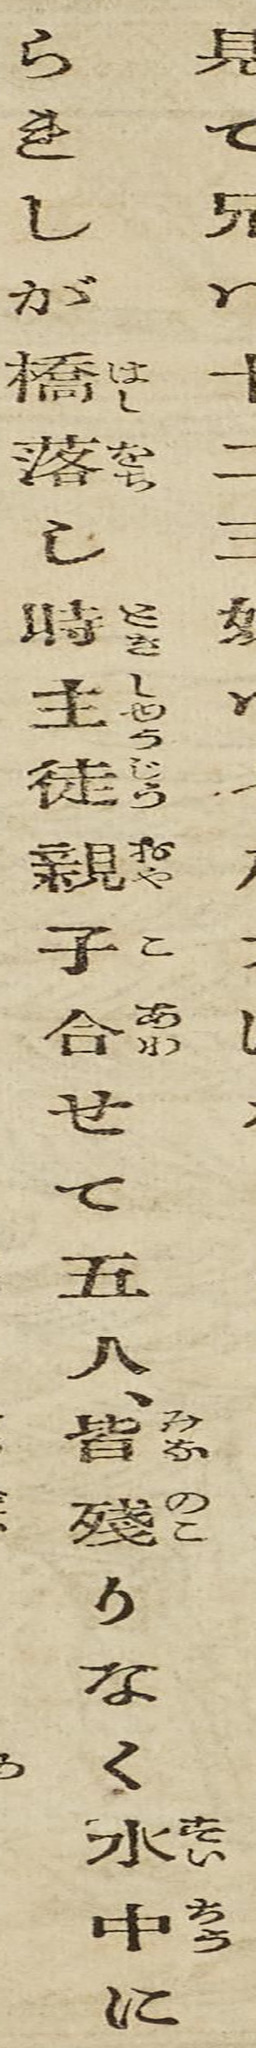られしが橋落し時主徒親子合せて五人、皆残りなく水中に
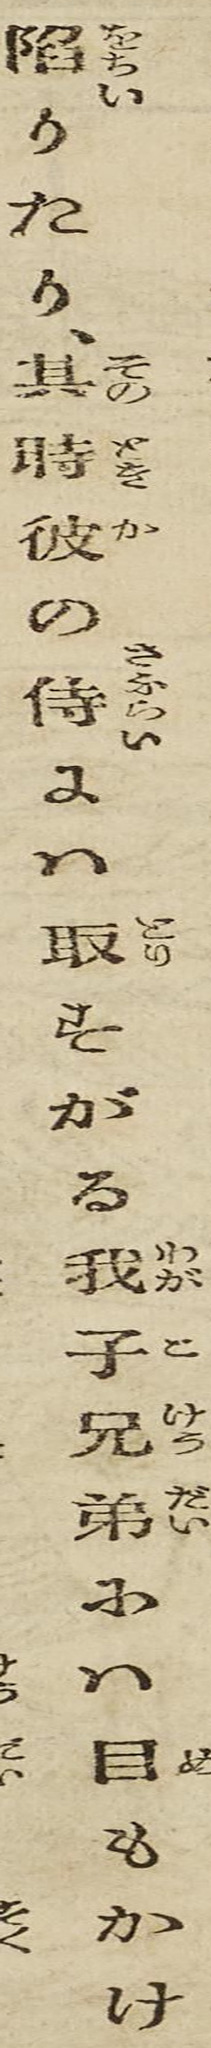陥りたり、其時彼の侍には取すがる我子兄弟には目もかけ
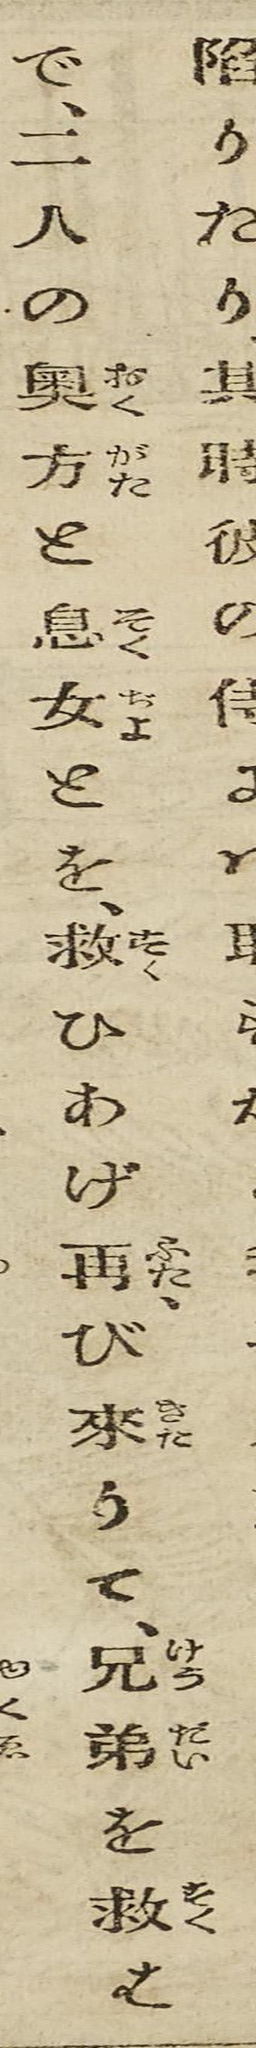で、二人の奥方と息女とを、救ひあげ再び来りて、兄弟を救は
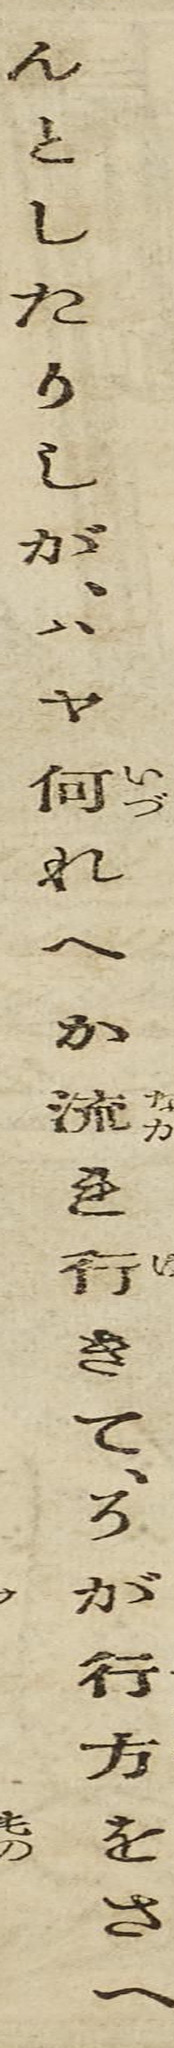んとしたりしが、ハヤ何れへか流れ行きて、そが行方をさへ
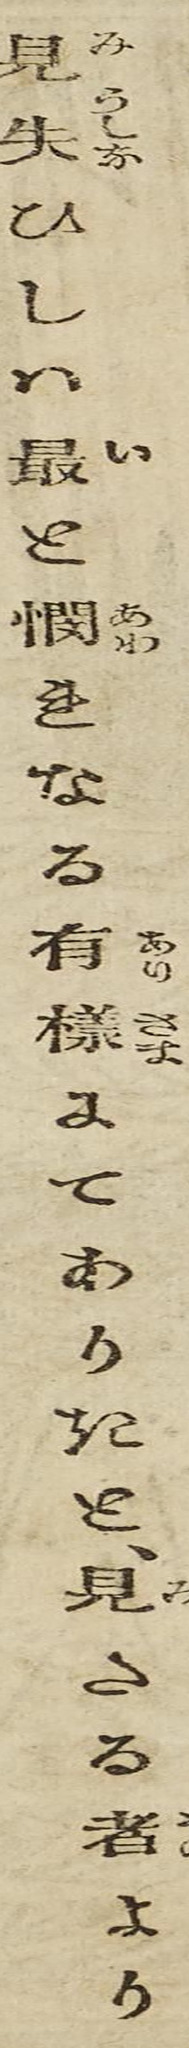見失ひしは最と憫れなる有様にてありきと、見たる者より
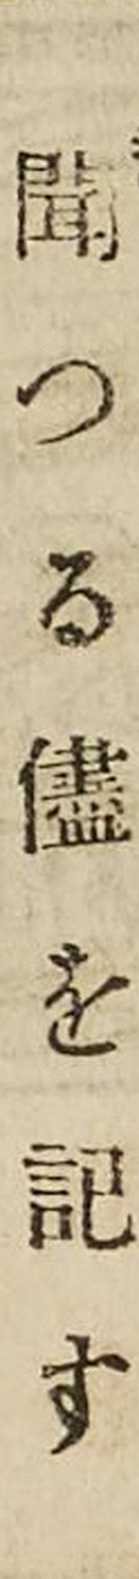聞つる侭を記す
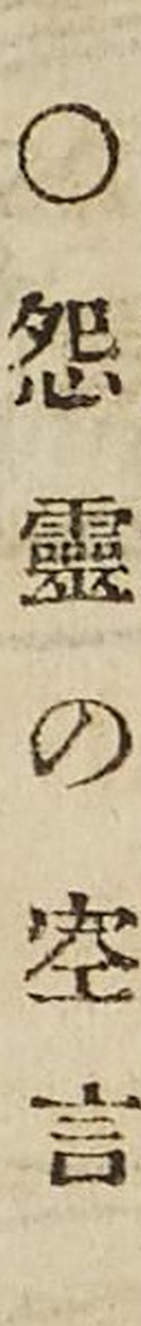○怨霊の空言
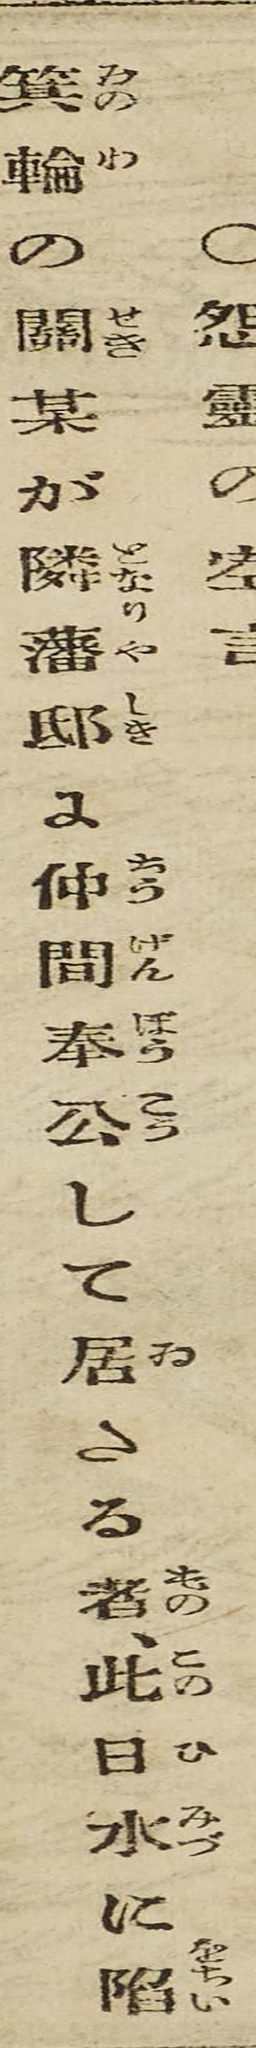箕輪の関某が隣藩邸に仲間奉公して居たる者、此日水に陥

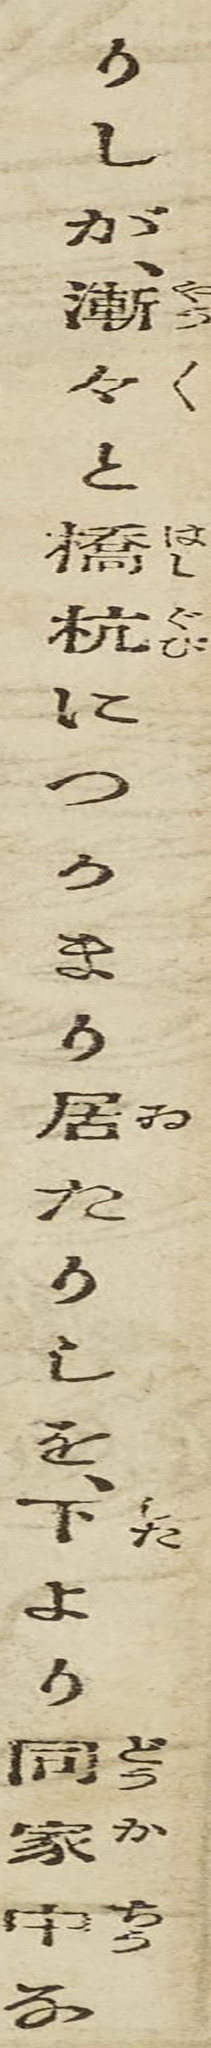りしが、漸々と橋杭につかまり居たりしを、下より同家中な
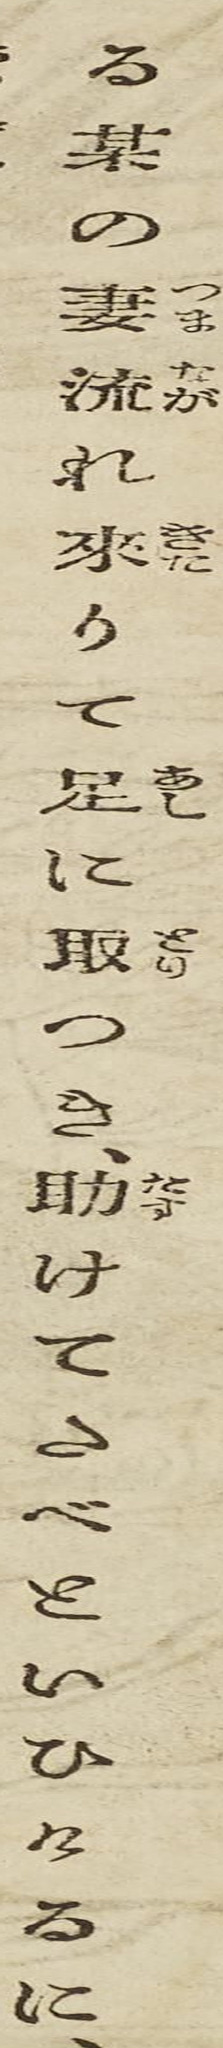る某の妻流れ来りて足に取りつき、助けてたべといひけるに、
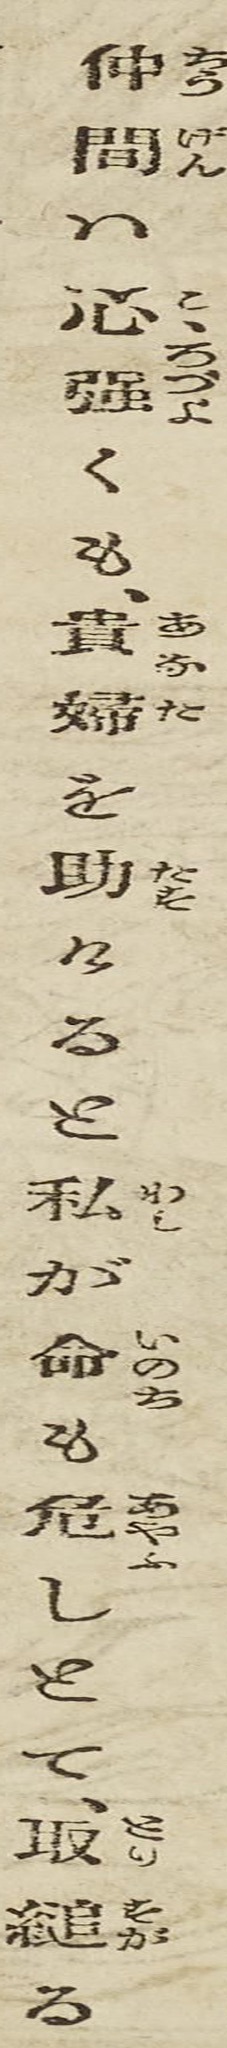仲間は心強くも、貴婦を助けると私が命も危しとて、取縋る
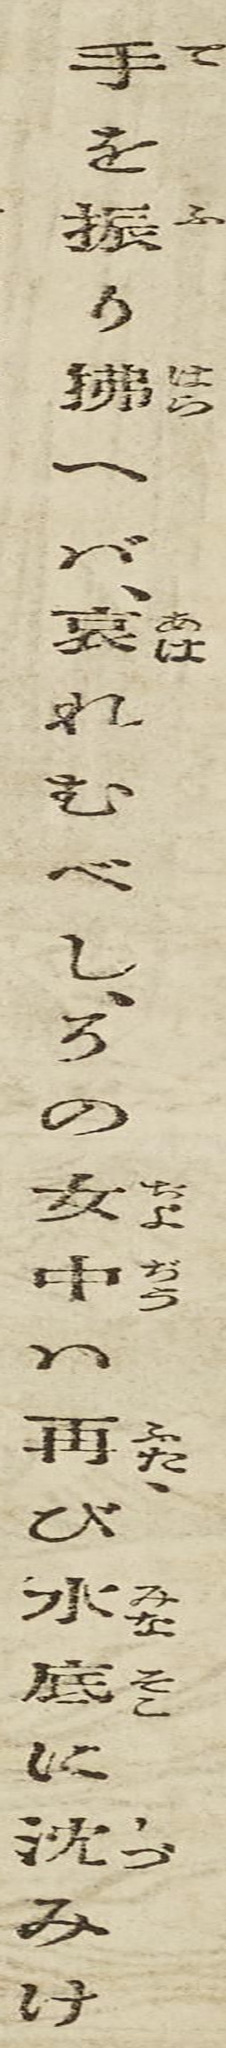手を振り払へば、哀れむべし、その女中は再び水底に沈みけ
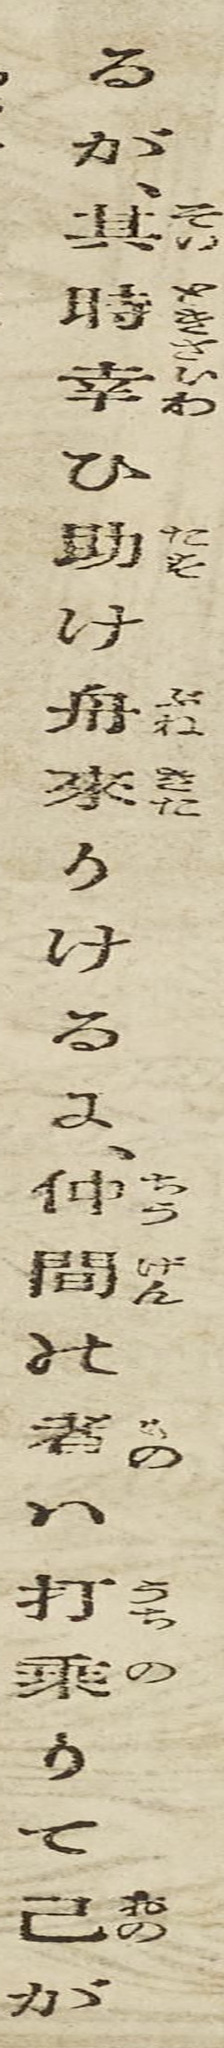るが、其時幸ひ助け舟来りけるに、仲間の者は打乗りて己が
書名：永代惨話　文化の夢　全
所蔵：東京大学地震研究所図書室 Earthquake Research Institute Library, The University of Tokyo, JAPAN
